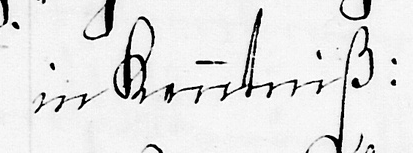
in Kenntniß:
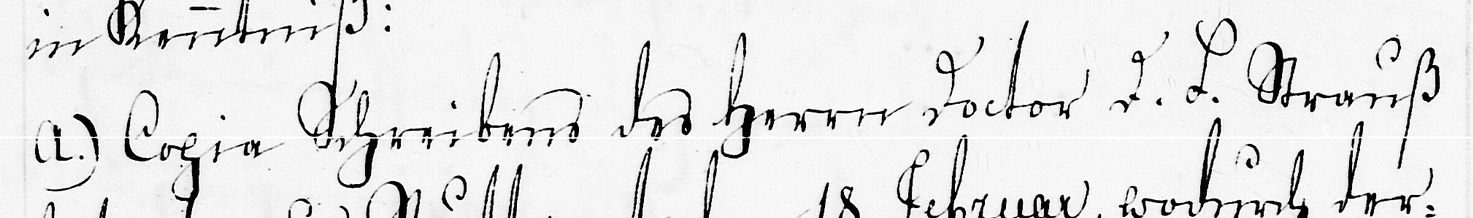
A.) Copia Schreibens des Herrn Doctor D. F. Strauß
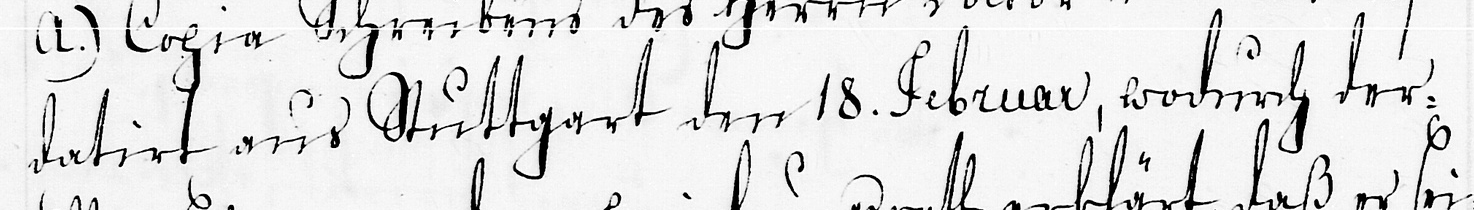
datirt aus Stuttgart den 18. Februar, wodurch der¬
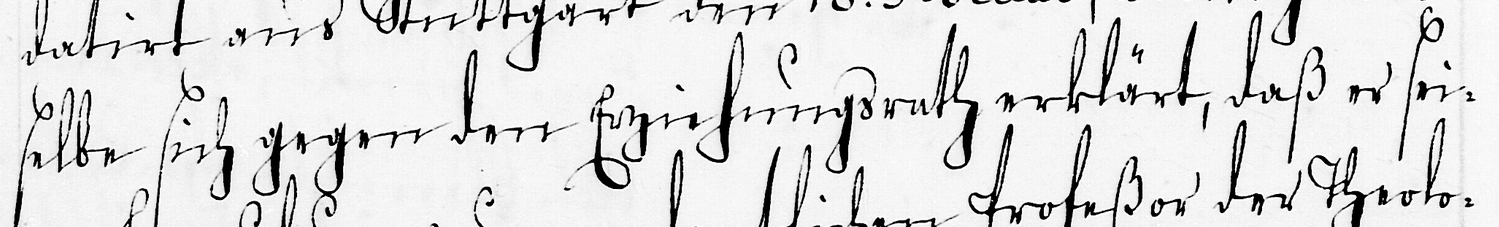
selbe sich gegen den Erziehungsrath erklärt, daß er se¬
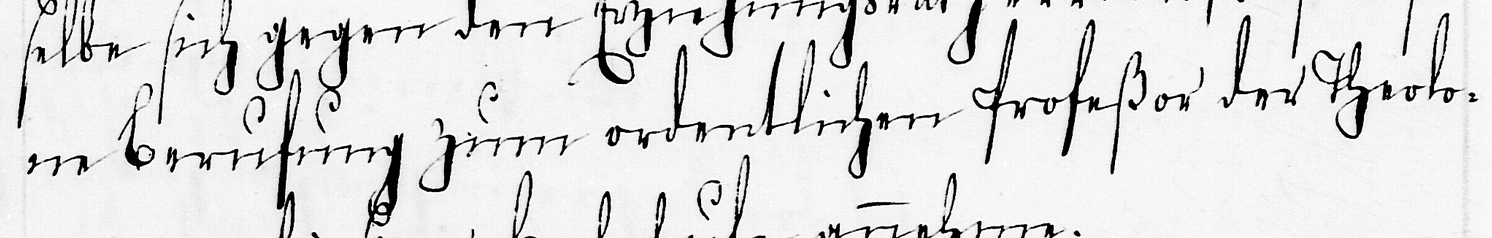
ine Berufung zum ordentlichen Profeßor der Theolo¬
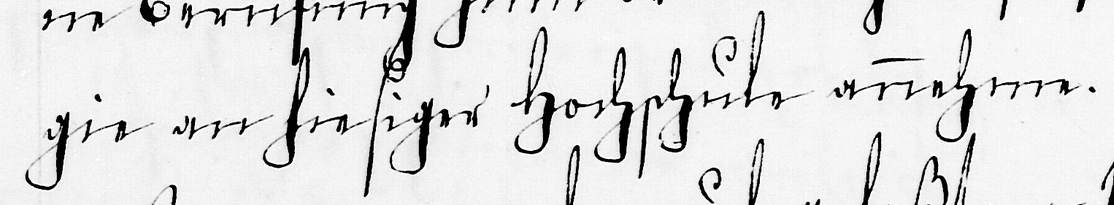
gie an hiesiger Hochschule annehme.
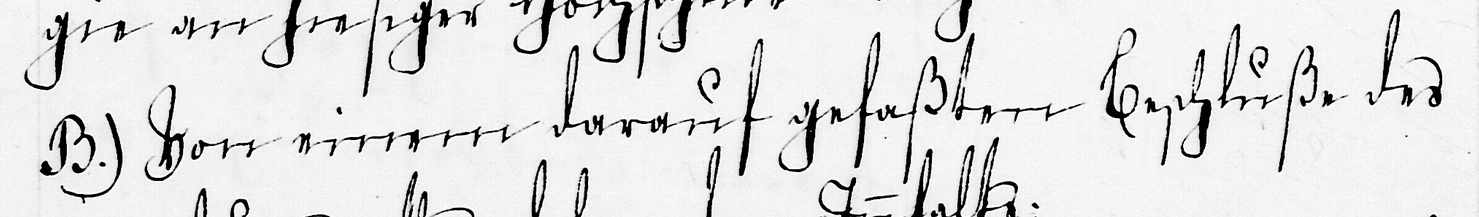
B.) Von einem darauf gefaßten Beschluße des
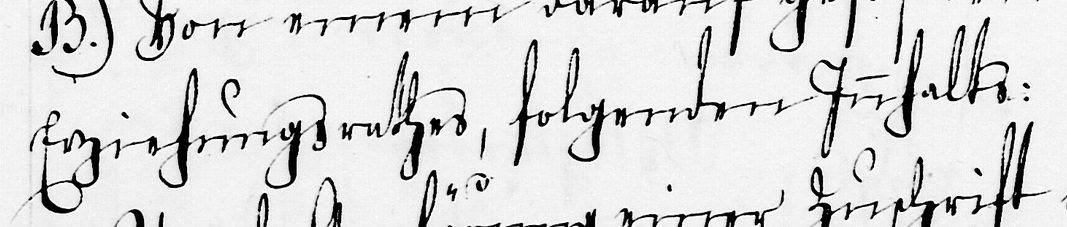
Erziehungsrathes, folgenden Innhalts:
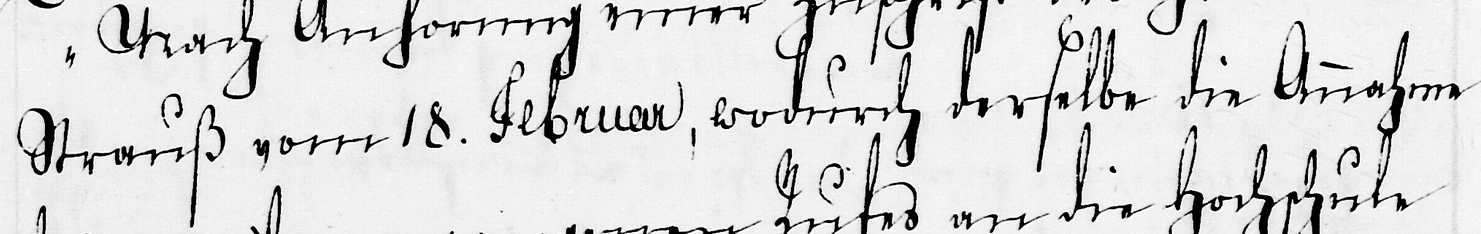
Strauß vom 18. Februar, wodurch derselbe die Annahme
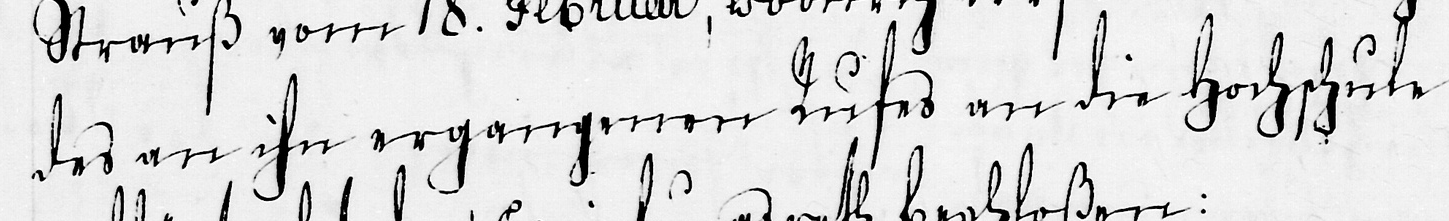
des an ihn ergangenen Rufes an die Hochschule
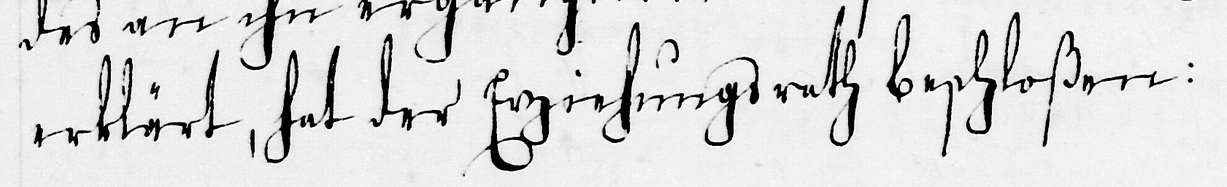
erklärt, hat der Erziehungsrath beschloßen:
